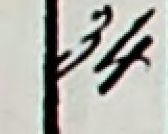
34
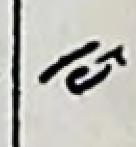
15
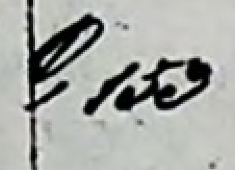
0,153
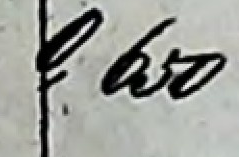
0,650
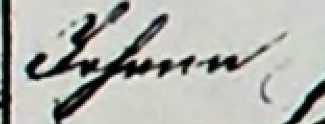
Johann
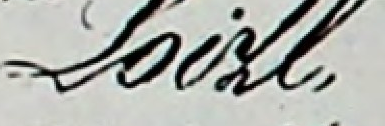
Loizl,
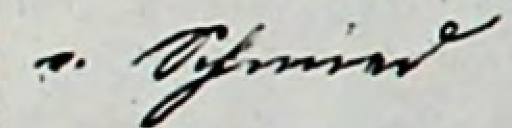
v. Schmied
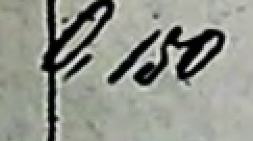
0,150
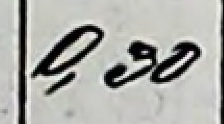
0,30
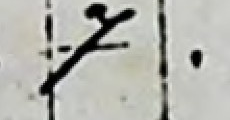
7
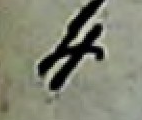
4
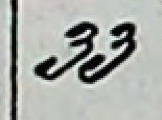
33
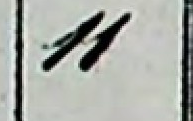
11
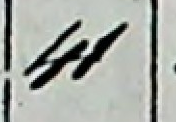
41
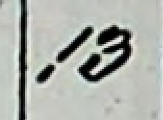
13
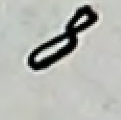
8
